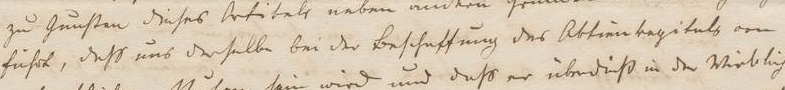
führt, daß uns derselbe bei der Beschaffung des Aktienkapitals von
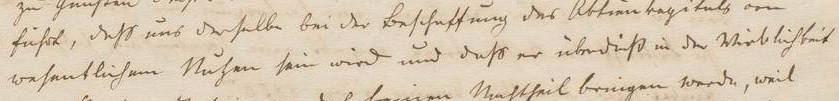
wesentlichem Nutzen sein wird und daß er überdieß in der Wirklichkeit
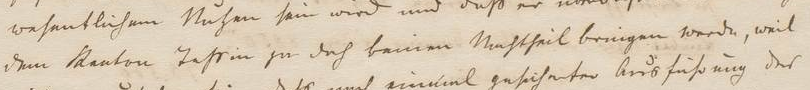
dem Kanton Tessin ja doch keinen Nachtheil bringen werde, weil
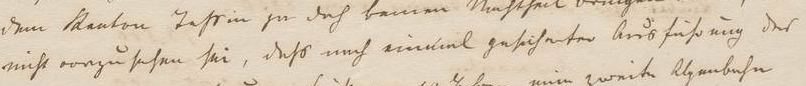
nicht vorzusehen sei, daß nach einmal gesicherter Ausführung des
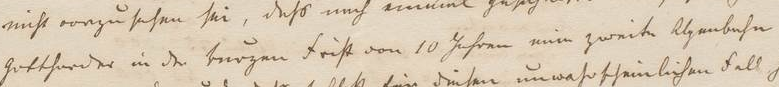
Gotthardes in der kurzen Frist von 10 Jahren eine zweite Alpenbahn
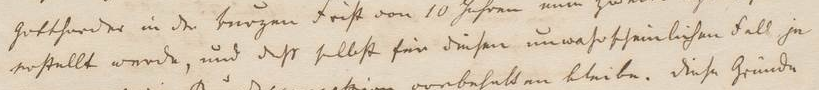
erstellt werde, und daß selbst für diesen unwahrscheinlichen Fall ja
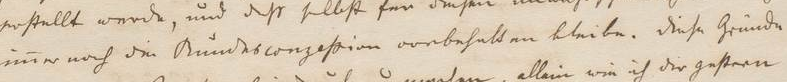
immer noch die Bundesconzession vorbehalten bleibe. Diese Gründe
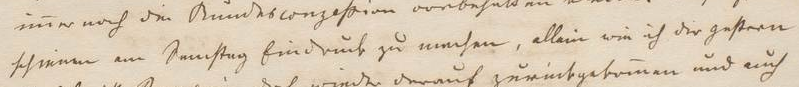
schienen am Samstag Eindrück zu machen, allein wie ich Dir gestern
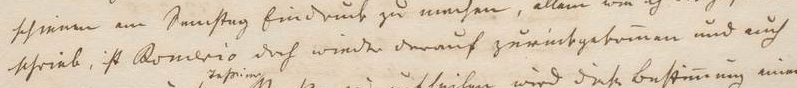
schrieb, ist Romerio doch wieder darauf zurückgekommen und auch
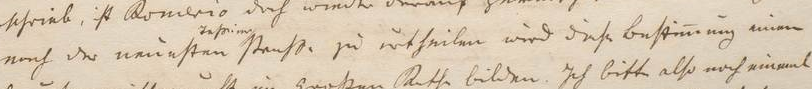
nach des neuesten Tessiner Preße zu urtheilen wird diese Bestimmung einen
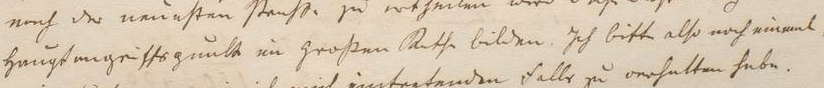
Hauptangriffspunkt im Großen Rathe bilden. Ich bitte also noch einmal,
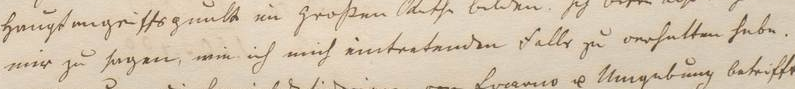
mir zu sagen, wie ich mich eintretenden Falls zu verhalten habe.
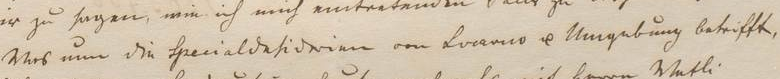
Was nun die Specialdesiderien von Locarno & Umgebung betrifft,
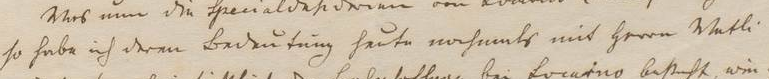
so habe ich deren Bedeutung heute nochmals mit Herrn Wetli
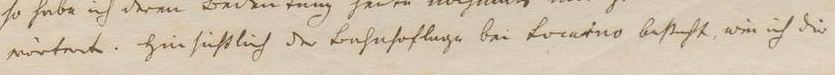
erörtert. Hinsichtlich der Bahnhoflage bei Locarno besteht, wie ich Dir
